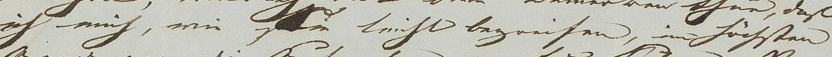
ich mich, wie Sie leicht begreifen, im höchsten
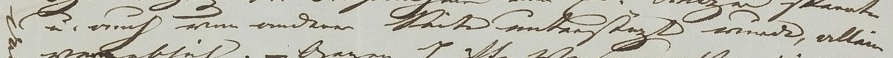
u. auch von anderer Seite unterstüzt wurde, allein
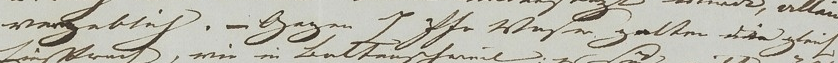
vergeblich. – Gegen Herrn Pfr. Waser galten die gleichen
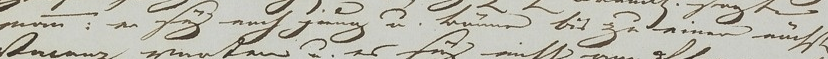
mann: er sey noch jung u. könne bis zu einer nächsten
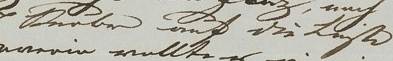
Surber auf die Lieste
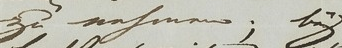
zu nehmen; bey
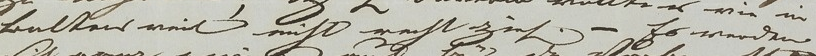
Baltensweil nicht recht ziehen. – Es werden
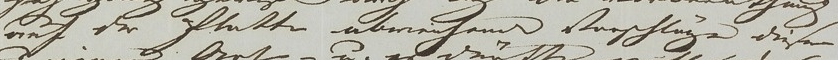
auf der Platte abweichende Vorschläge dieser
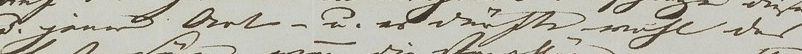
u. jener Art – u. es dürfte wohl das
